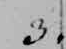3
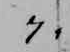7
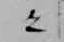2
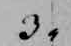3
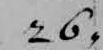26
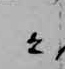2
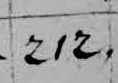212
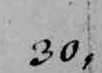30
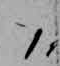1
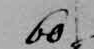60
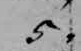5
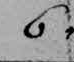6
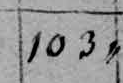103
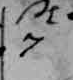7
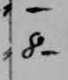8
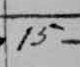15
